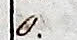0.
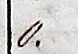0.
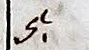5.
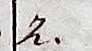2.
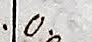0.
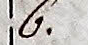6.
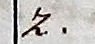2.
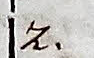2.
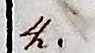4.
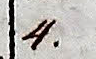4.
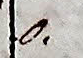0.
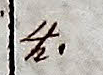4.
